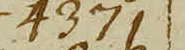4371
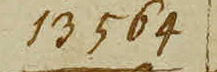13564
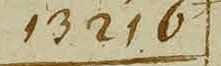13216
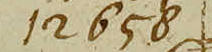12658
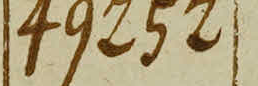49252
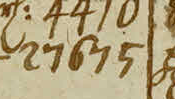27675
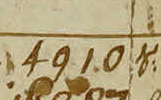4910
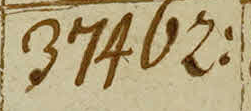37462
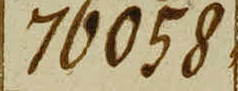76058
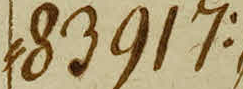83917
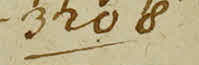3208
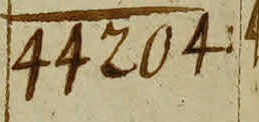44204
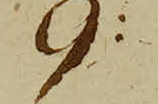9:
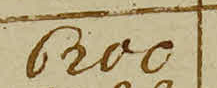6200
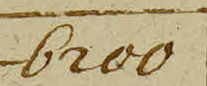6200
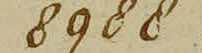8988
